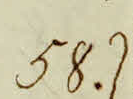58.
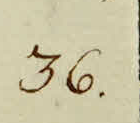36.
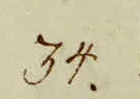34.
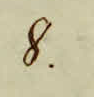8.
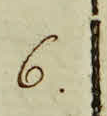6.
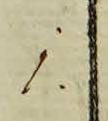1.
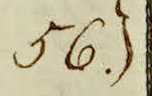56.
